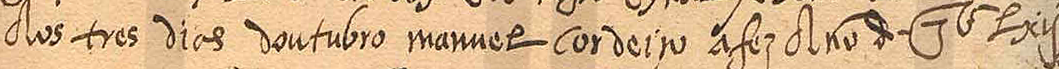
Aos tres dias doutubro manuel cordeiro a fez An̄o de jbc lxij
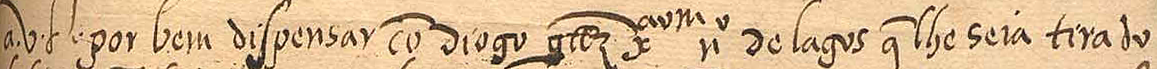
a V. A. por bem dispensar cō diogo ḡllz xaom no de lagos q̄ lhe seia tirado
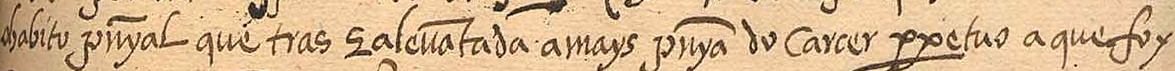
o habito pn̄yaL que tras E aleūatada a mays pn̄ya do carcer ꝑpetuo a que foy
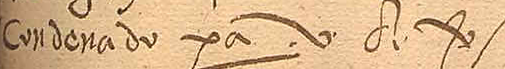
condenado ꝑa V. A. ꝟ /
